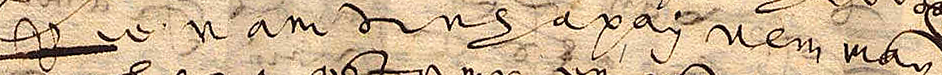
Ree nam tinha pay nem mãy
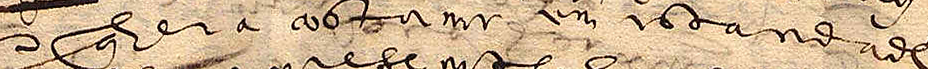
e q̄ hera costume em esta cidade
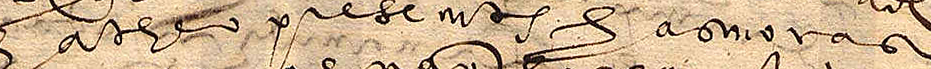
hathe o presemte has moças
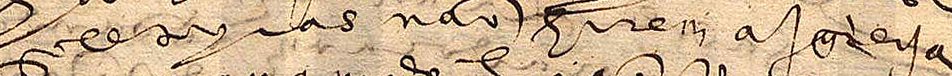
sollteyras naõ hirem a JgreiJa
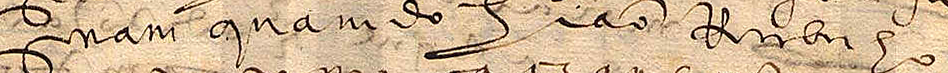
senam quamdo hiaõ Receber ho
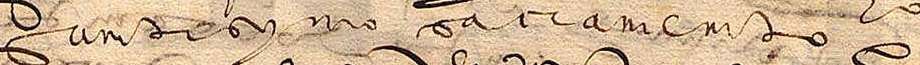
samtisymo sacramemto e
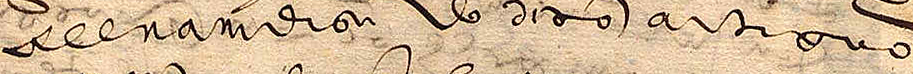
all nam dise do dito artiguo
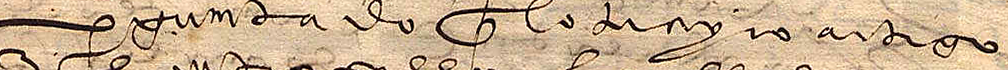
item ꝑgumtado pelo terceyro artigo
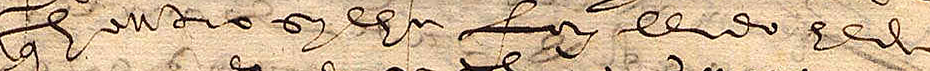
q̄ houtrosy lhe foy llido he de
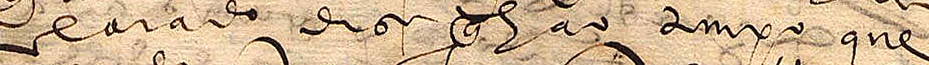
clarado dise q̄ hao tempo que
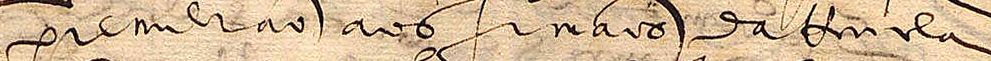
premderaõ aos Jrmãos da Ree ela
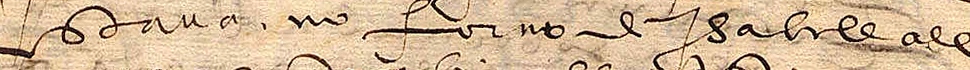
estaua no forno de Jsabell all
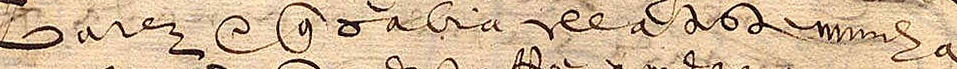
varez e q̄ sabia ella testemunha
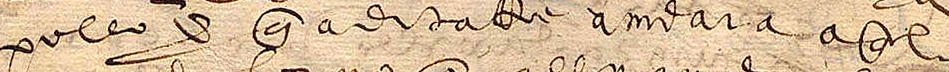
pollo ꝟ q̄ a dita Re amdara aq̄le
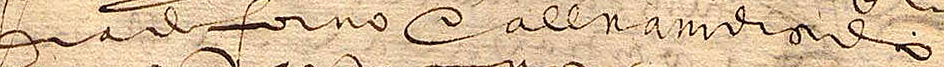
dia do forno e all nam dise do
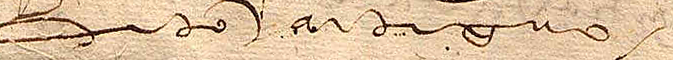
dito artiguo /
